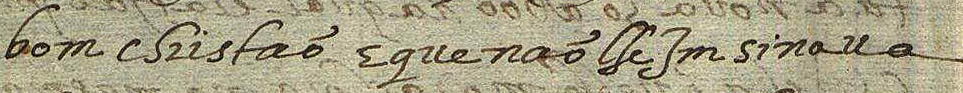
bom christaõ E que naõ lhe Jmsinaua
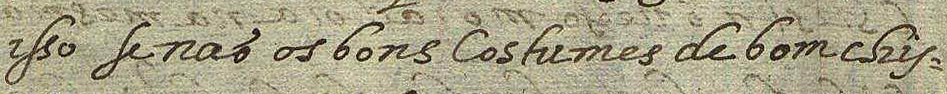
isso senaõ os bons Costumes de bom chris
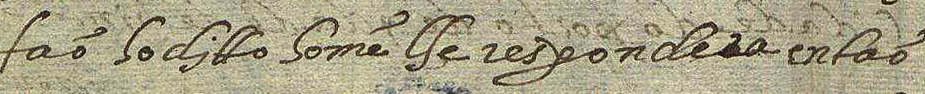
taõ ho djtto homē lhe respondera entaõ
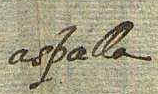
as palla
